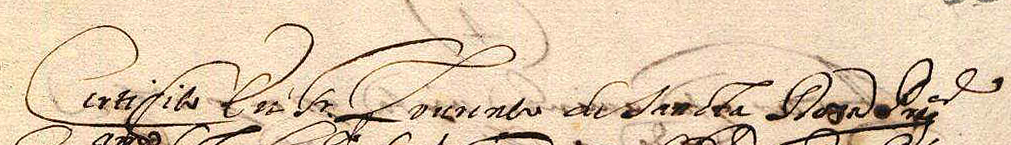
Certifico Eu Fr Lourenço de Sancta Roza Pregor
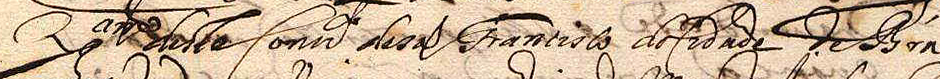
Rgam deste Conuto de saõ Francisco da Cidade de Bra
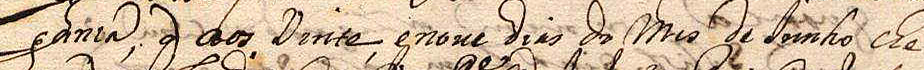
gança, q̄ aos Vinte e noue dias do mes de Iunho che
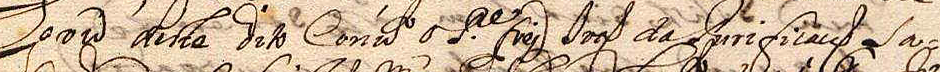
gou deste dito Conuto o P.e frej Ioaõ da Purificaçaõ sa
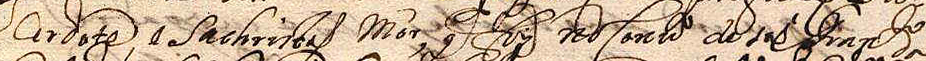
cerdote, e sachristaõ mor q̄ foy no Conto de saõ Franco
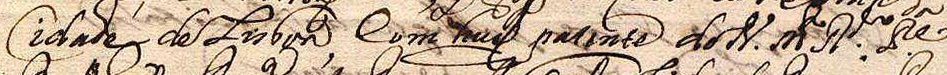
Cidade de Lisboa, Com huā patente de N. Mto R.do P.e
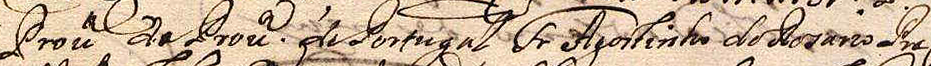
Proual da Prou.a de Portugal Fr Agostinho do Rosario Pre
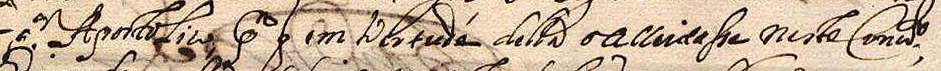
g.or Apostolico, pa q̄ em Vertude della o acceitasse neste Conu.to,
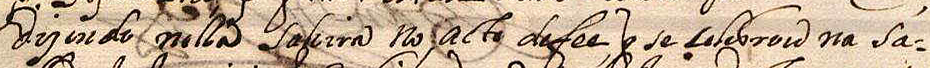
dizendo nella sahira no acto da fee, q̄ se celebrou na sa
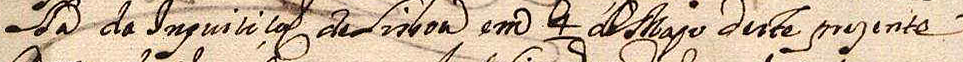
lla da Inquisiçaõ de Lisboa em 4 de Majo deste prezente
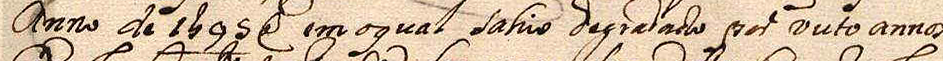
Anno de 1695 ā em o qual sahio degradado por outo annos
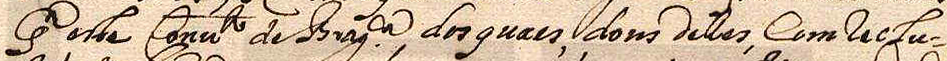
pa este Conuto de Brag.ça, dos quaes dous delles Com Reclu
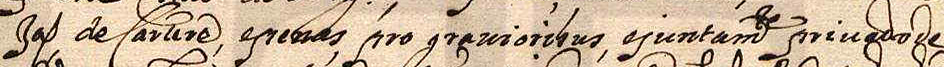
zaõ de Carcere, e penas pro grauioribus, e juntamte priuado de
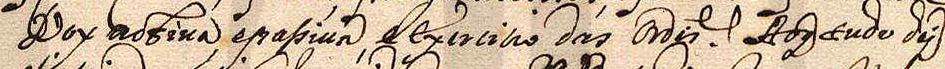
Vox actiua e passiua, e exercicio das ordēs. Ao q̄ tudo dej
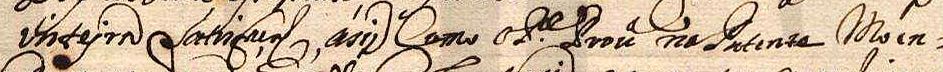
intejra satisfaçaõ, assj̄ Como o P.e Proual na Patente Mo en
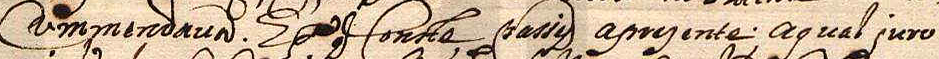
commendaua. E pa q̄ Conste passej a prezente, a qual juro
